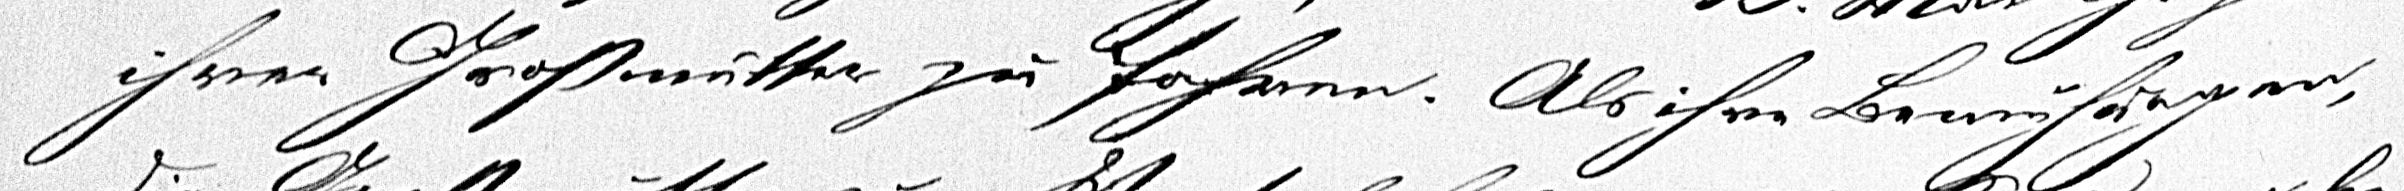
ihren Großmutter zu Jahren. Als ihre Bexxgen,
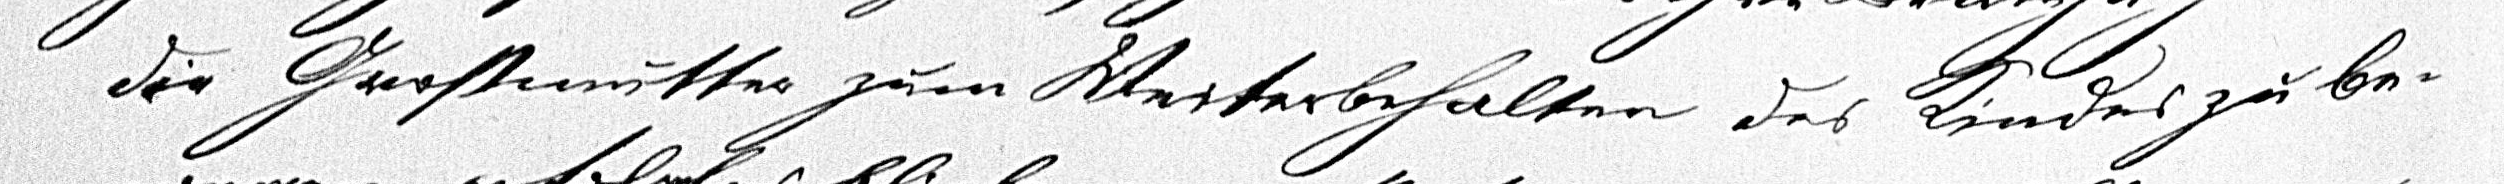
die Großmutter zum Weiterbehalten des Kindes zu be¬
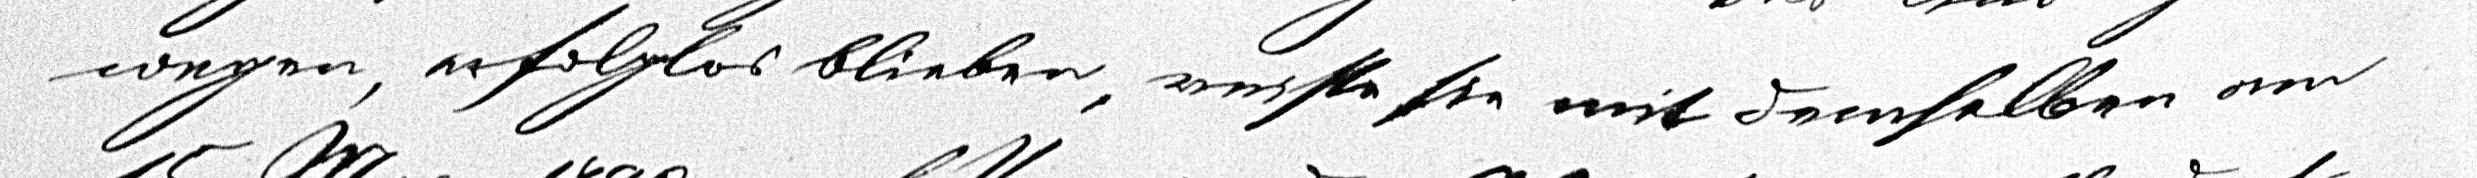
wegen, erfolglos blieben, reiste sie mit demselben am
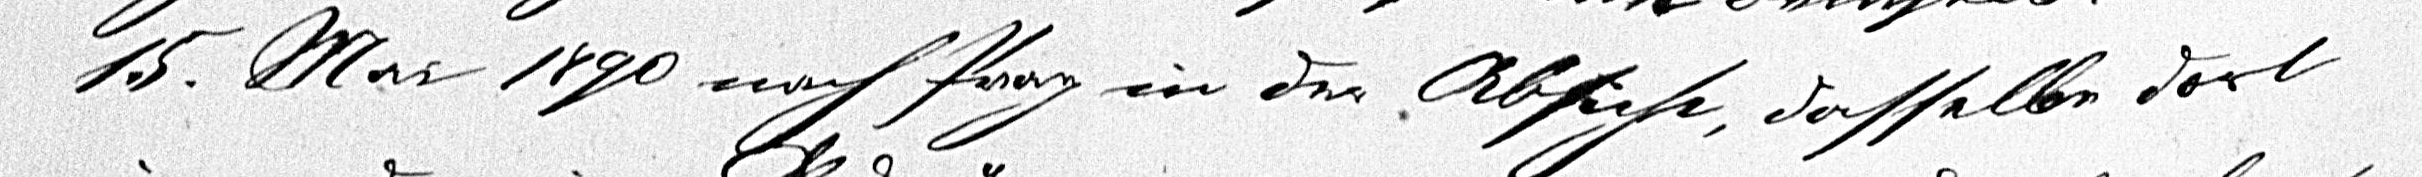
15. Mai 1890 nach Prag in der Absicht, dasselbe dort
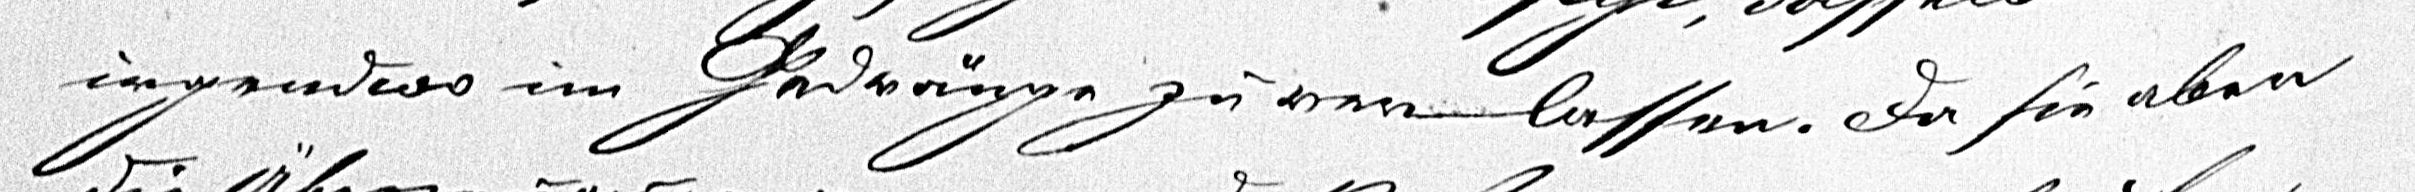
irgendwo im Gedränge zu verlassen. Da sie aber
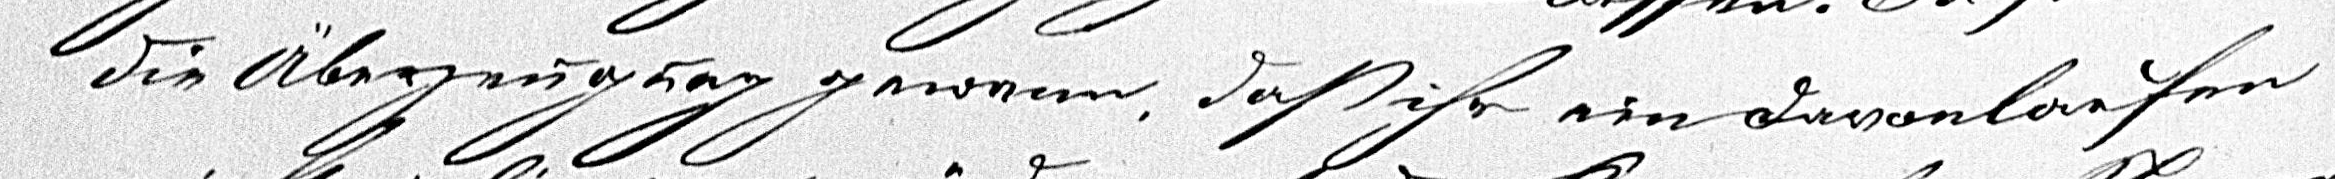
die Überzeugung gewann, daß ihr ein Davonlaufen
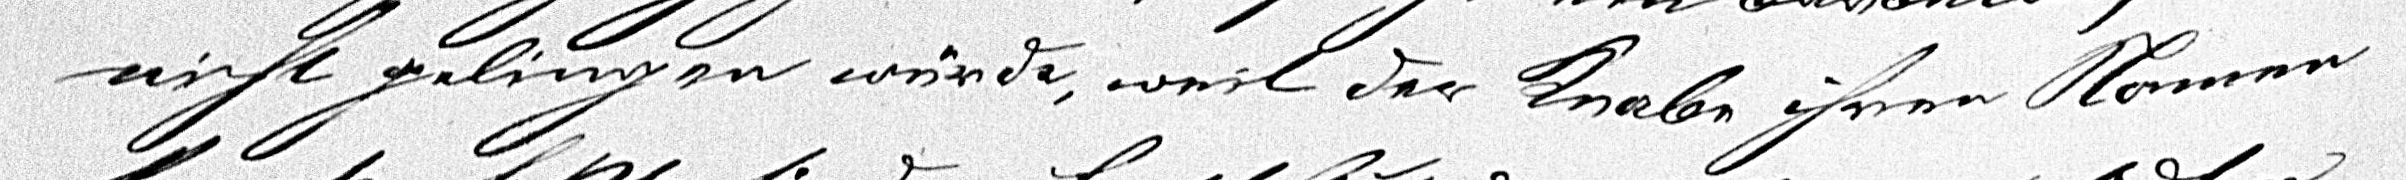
nicht gelingen würde, weil der Knabe ihren Namen
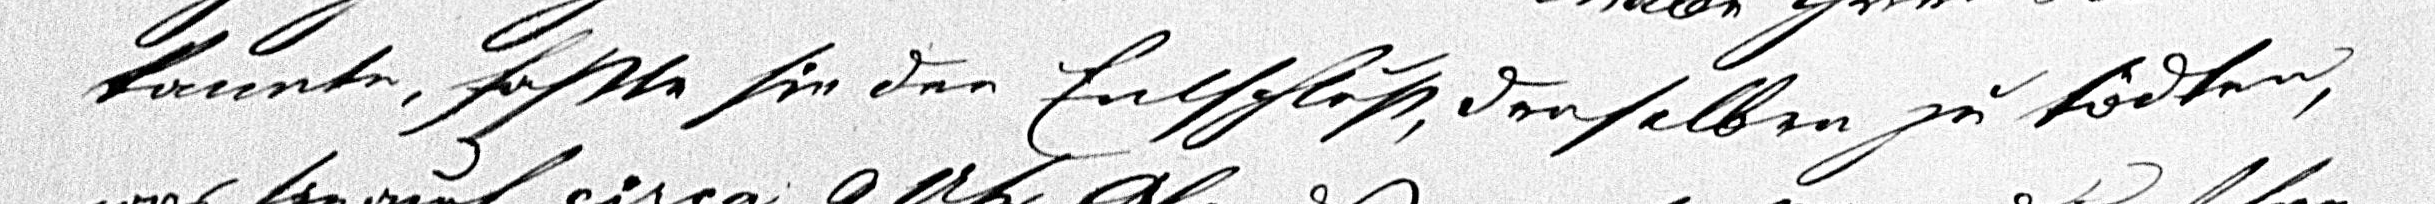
kannte, faßte sie der Entschluß, denselben zu tödten,
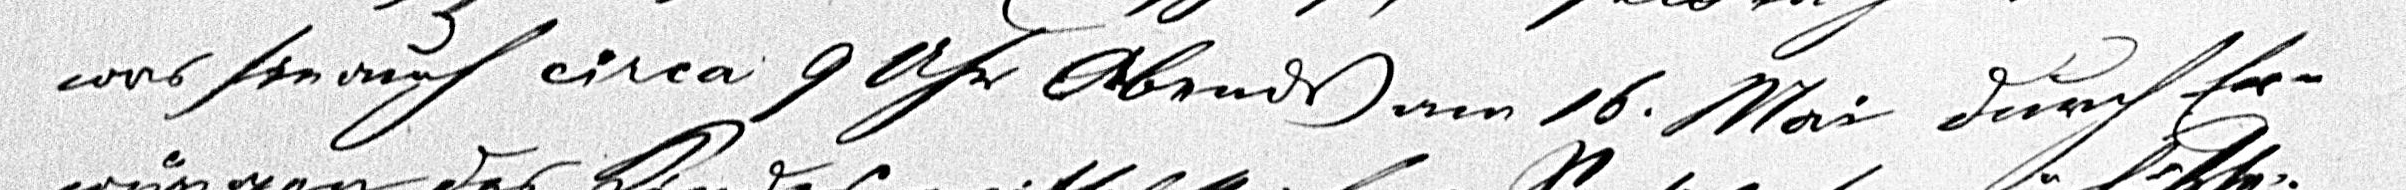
was sie auch circa 9 Uhr Abends am 16. Mai durch Er¬
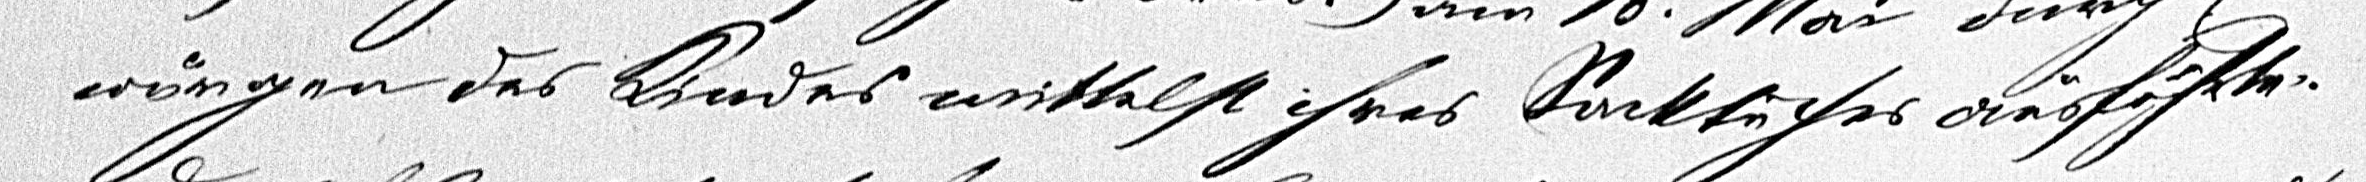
würgen des Kindes mittelst ihres Sacktuches ausführte.
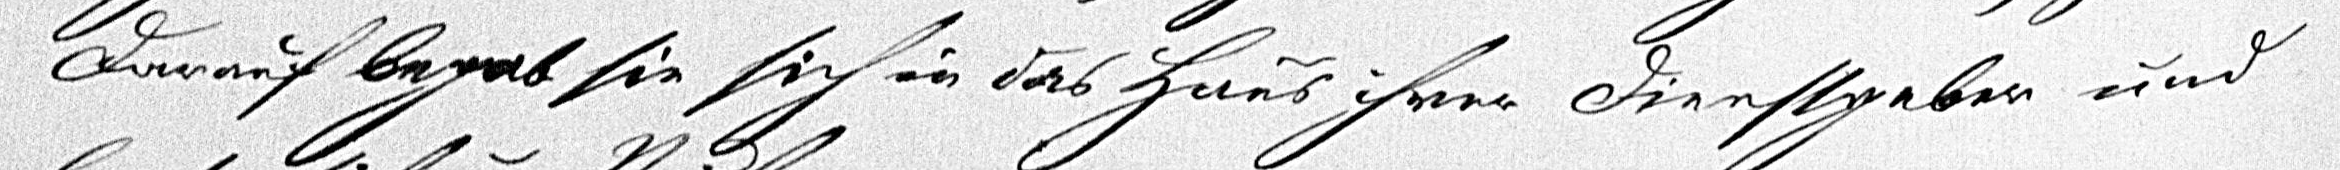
Darauf begab sie sich in das Haus ihrer Dienstgeber und
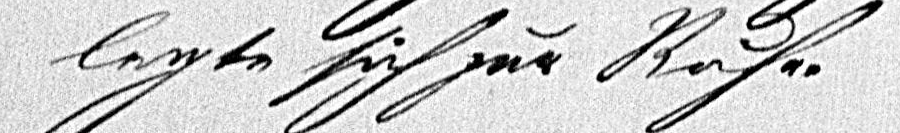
legte sich zur Ruhe.
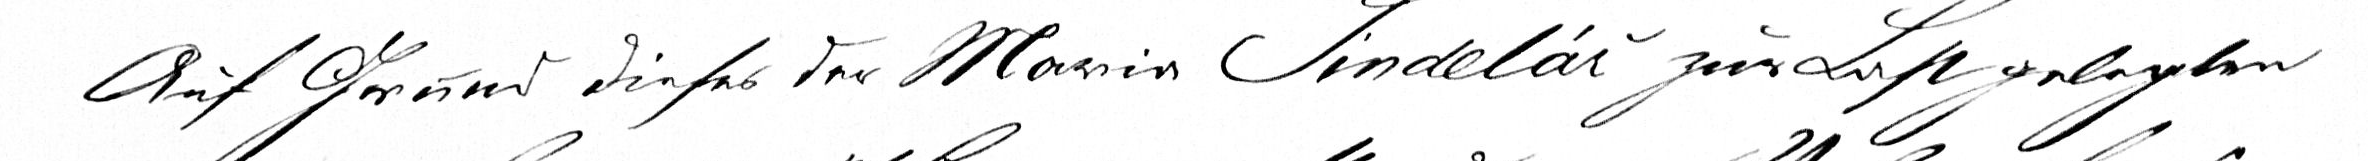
Auf Grund dieses der Maria Šindelař zu Last gelegten
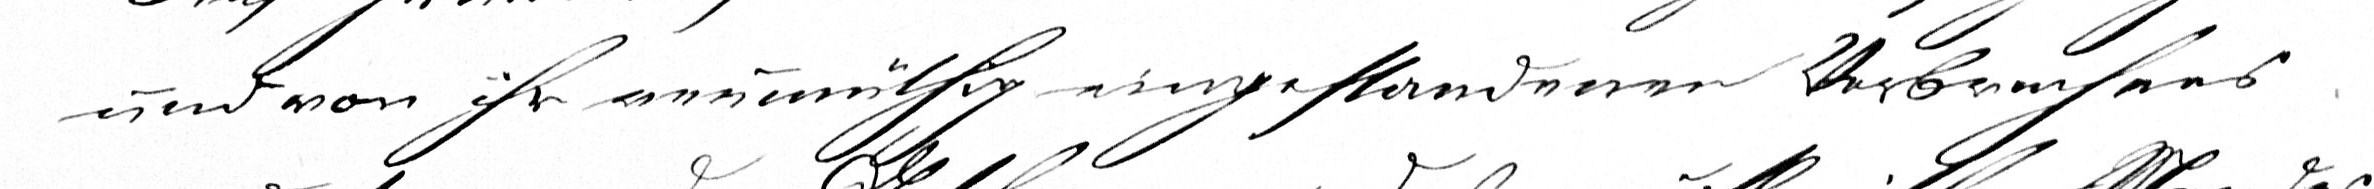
und von ihr reumüthig eingestandenen Verbrechens
